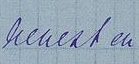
Berichte von
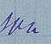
Herrn
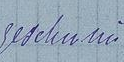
geschwunden;
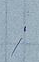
die
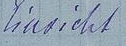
Einsicht
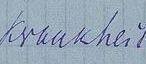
beigetragen haben,
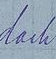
doch
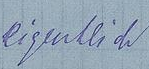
eigentlich
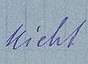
nicht
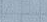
der Welt
